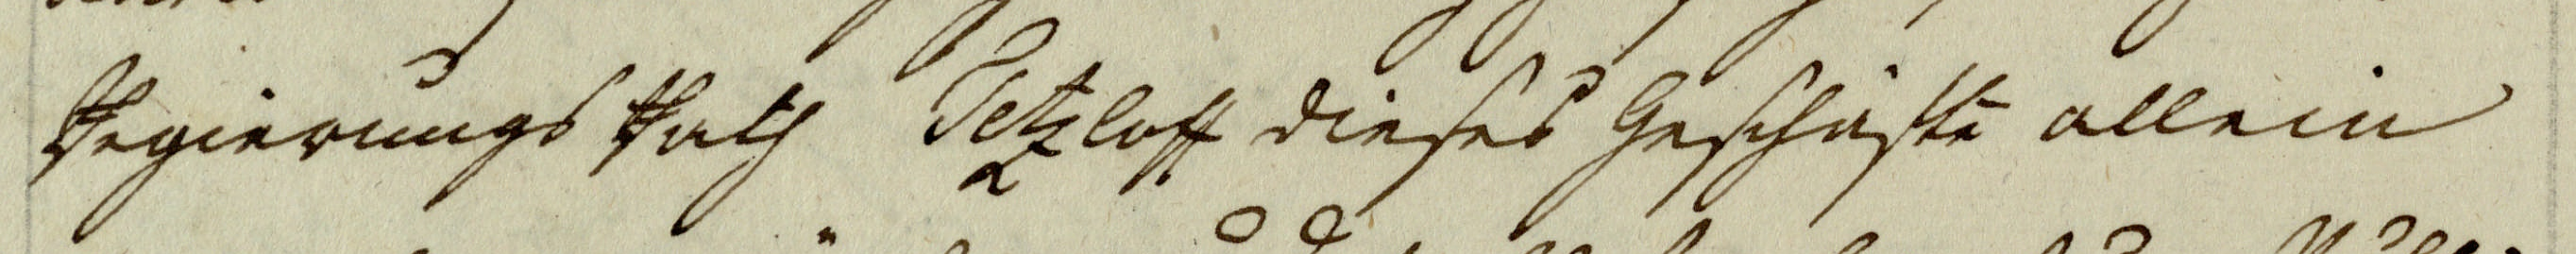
Regierungs Rath Tetzloff dieses Geschäfte allein
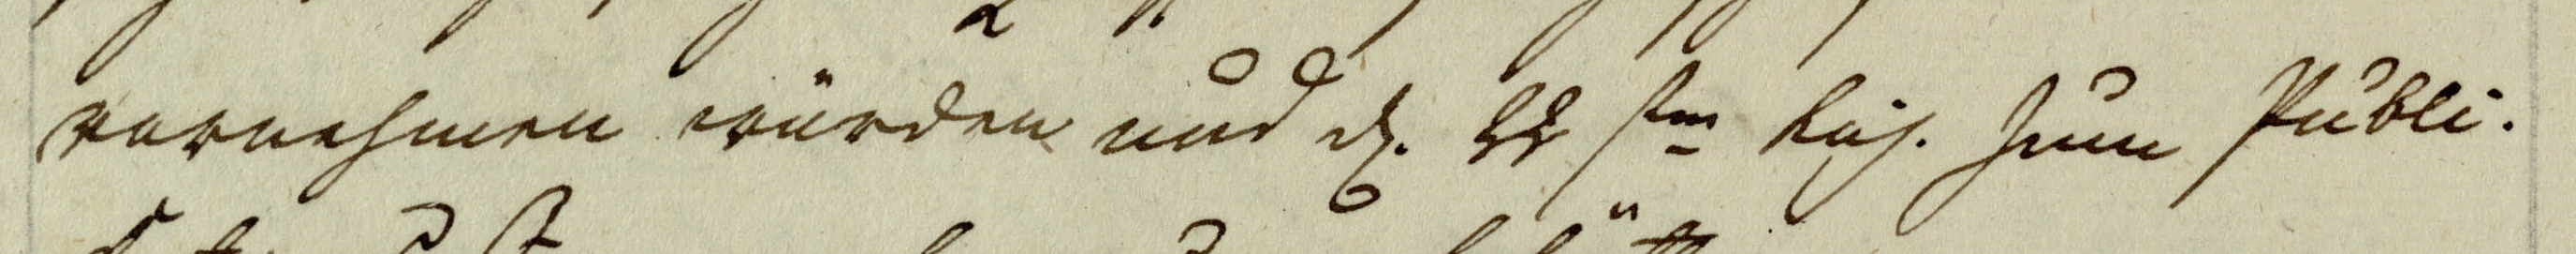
vornehmen würden und d. 22 ten huj. zum Publi¬
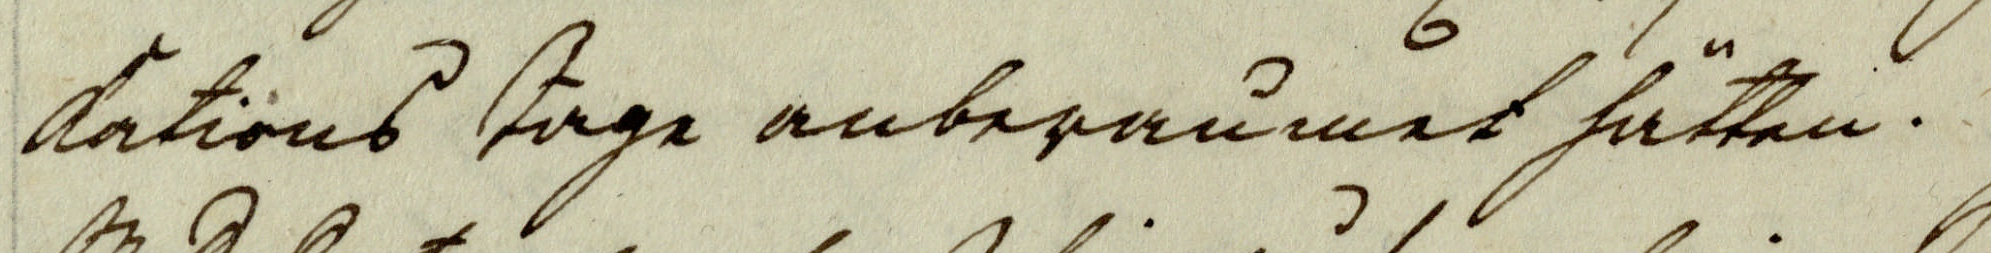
kations Tage anberaumet hätten.
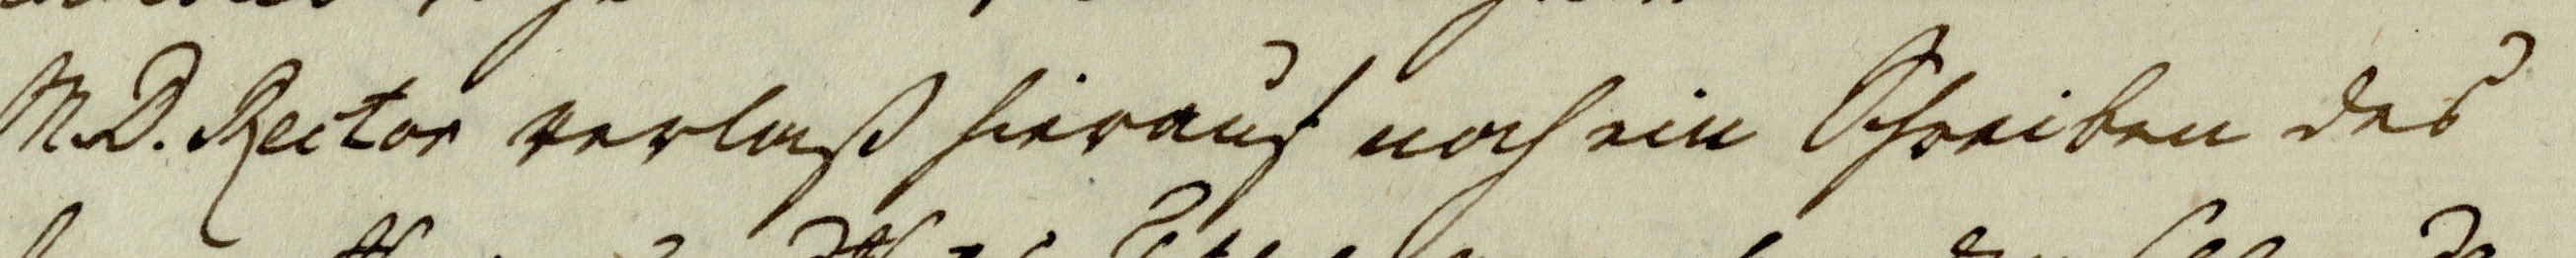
M. D. Rector verlaß hierauf noch ein Schreiben des
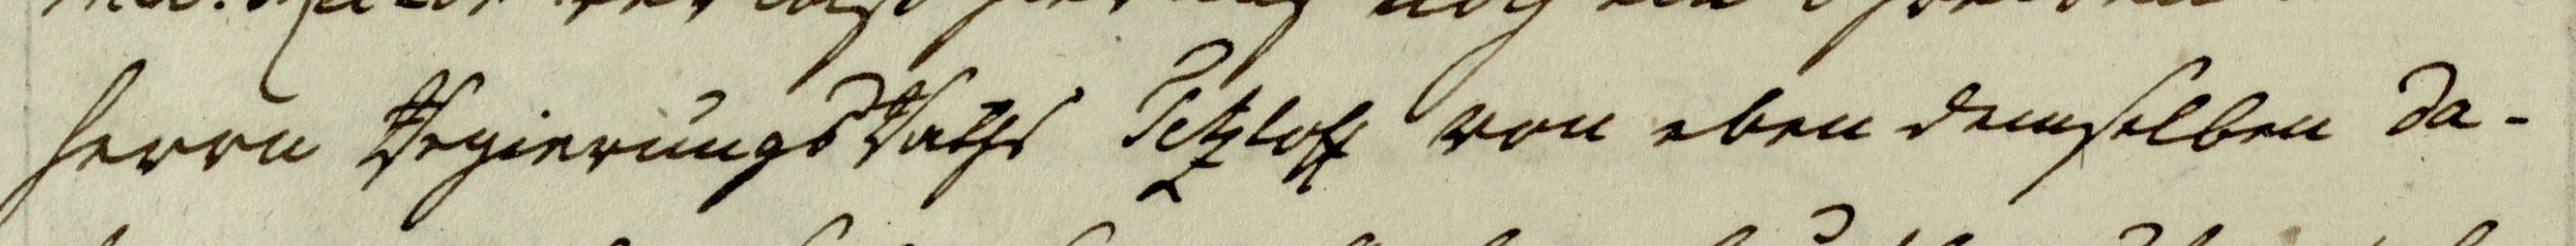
Herrn Regierungs Raths Tetzloff von eben demselben da¬
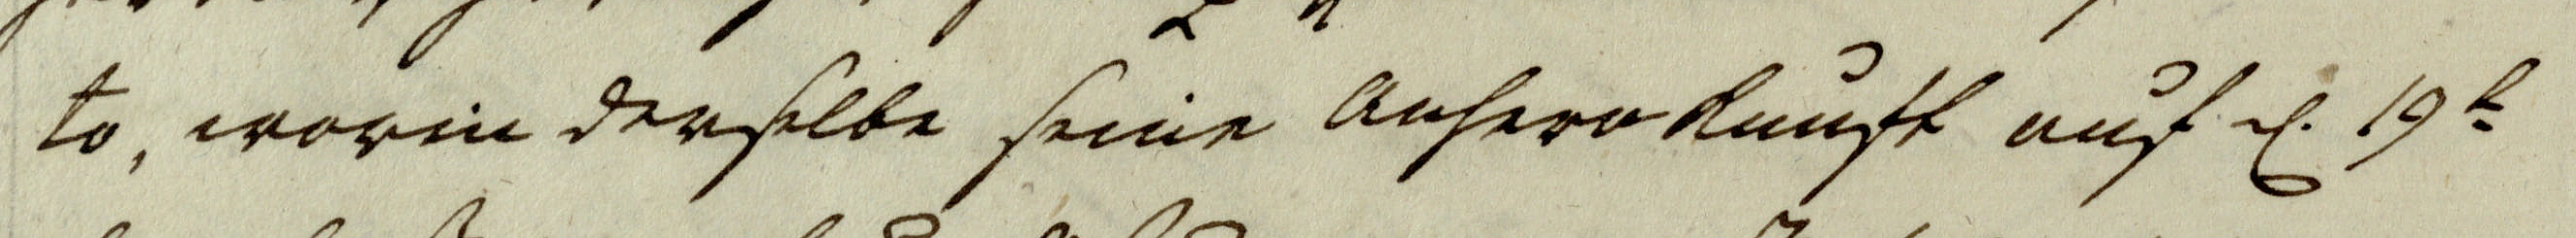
to, worin derselbe seine Anherokunft auf d. 19 ten
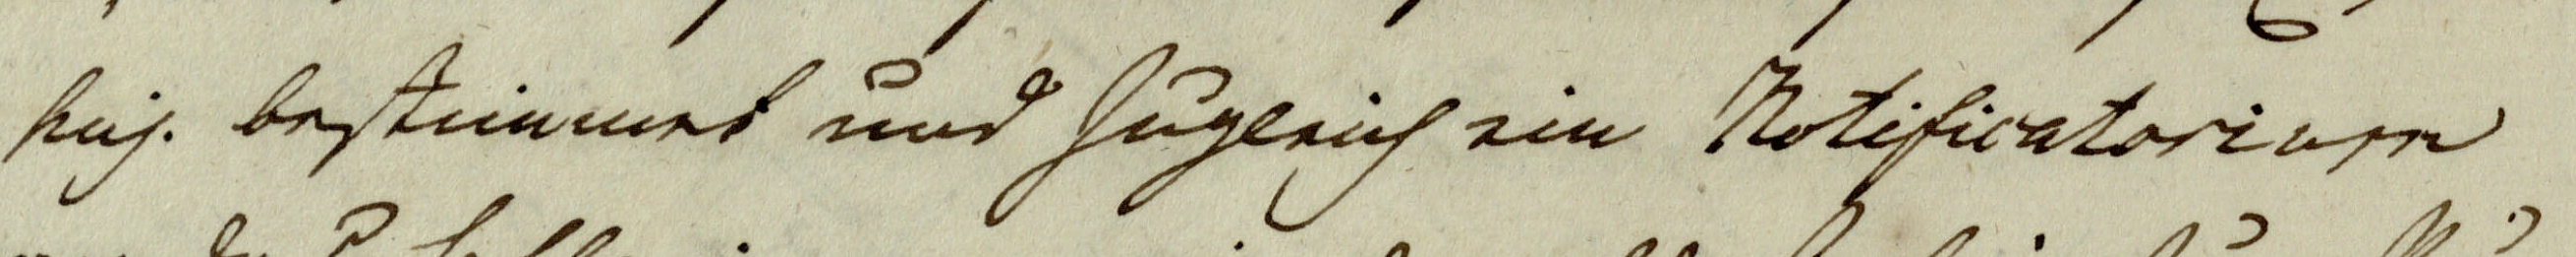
huj. bestimmet und zugleich ein Notificatorium
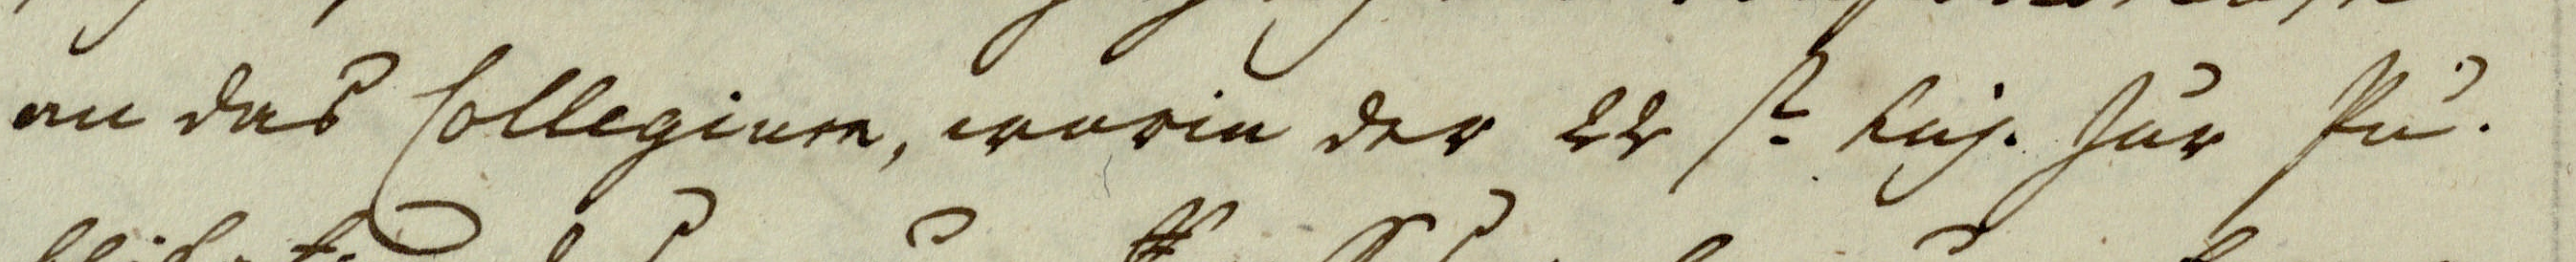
an das Collegium, worin der 22 ste huj. zur Pu¬
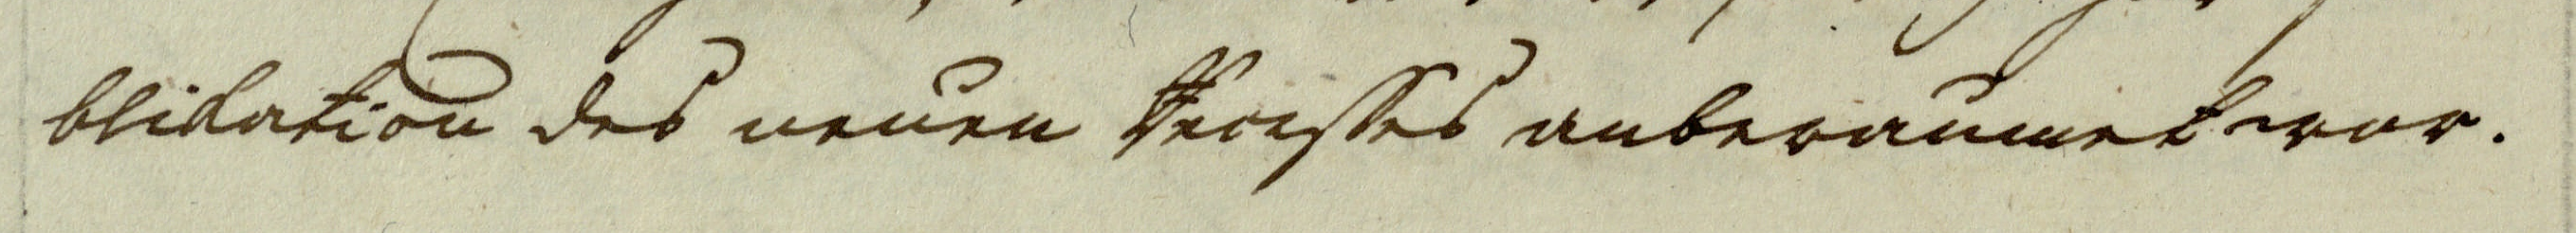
blikation des neuen Recesses anberaumet wor¬
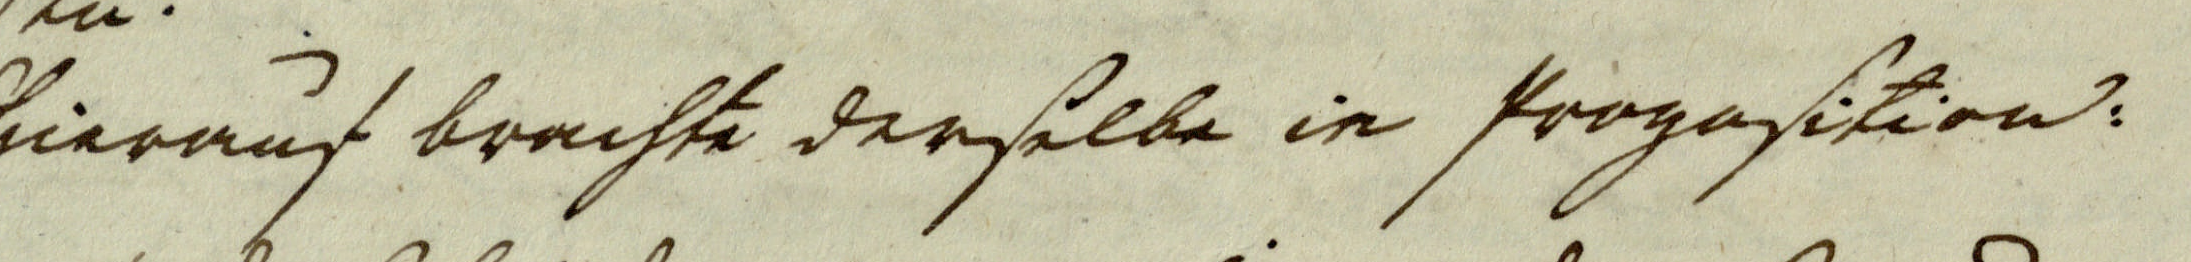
Hierauf brachte derselbe in Proposition:
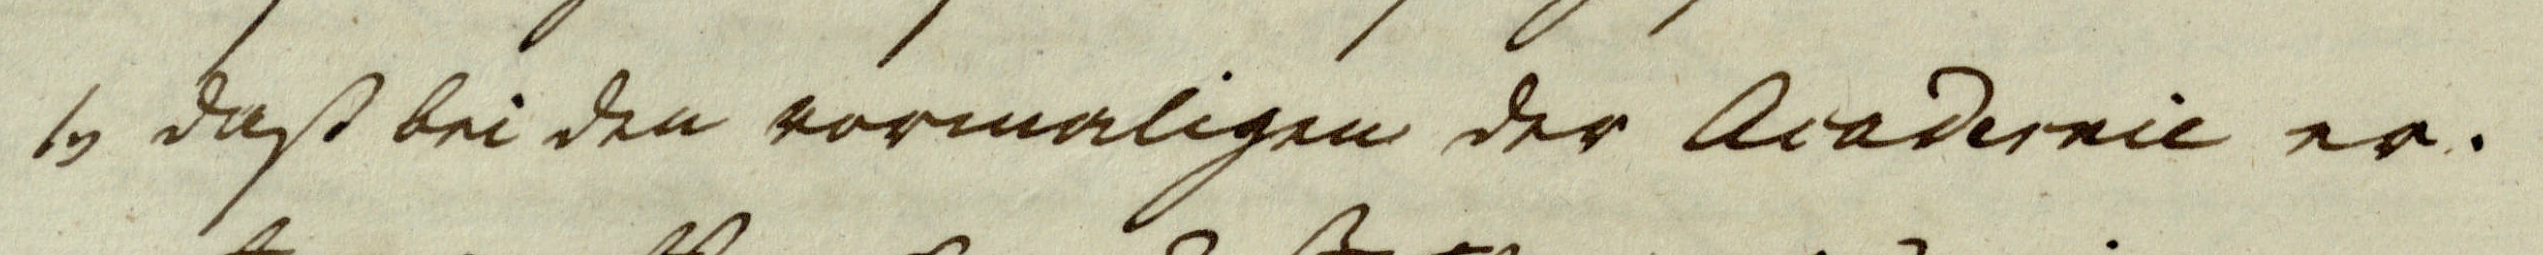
1., daß bei den vormaligen der Academie er¬
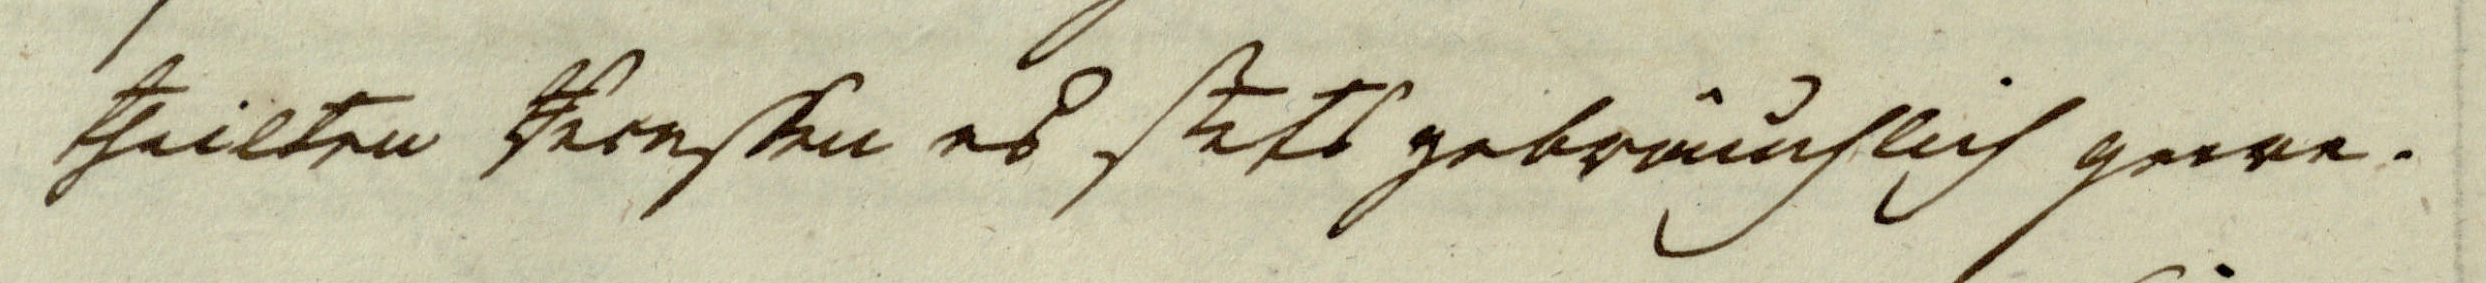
theilten Recessen es stets gebräuchlich gewe¬
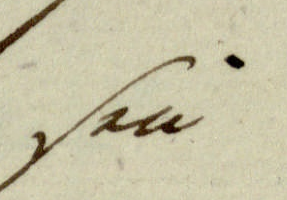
sen
